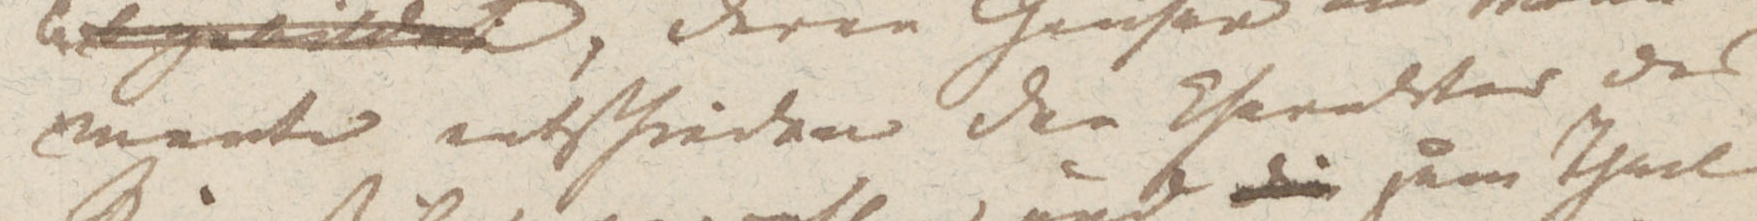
mente entschieden den Charakter des
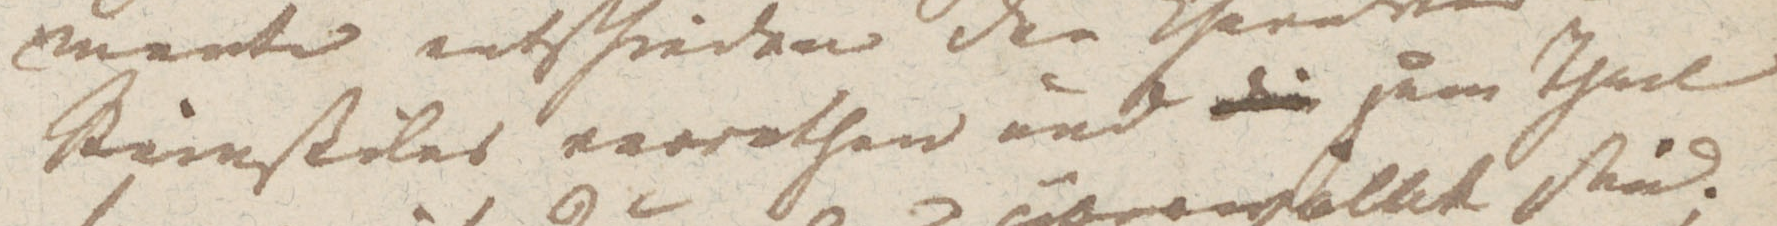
Steinstiles verrathen und die zum Theil
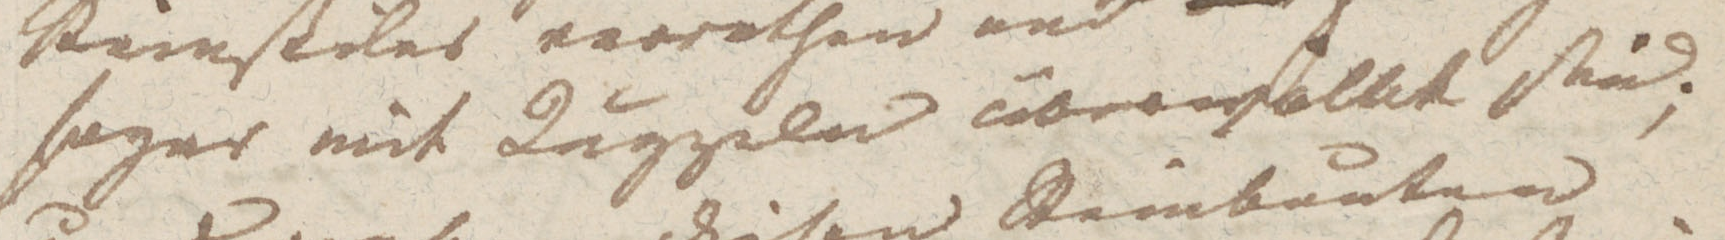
sogar mit Kuppeln überwölbt sind;
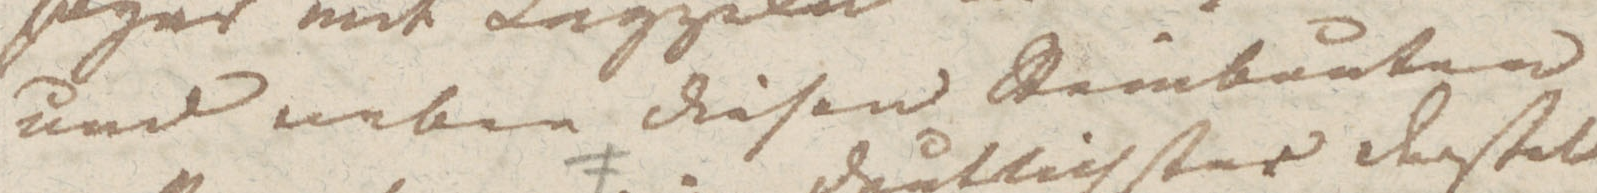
und neben diesen Steinbauten
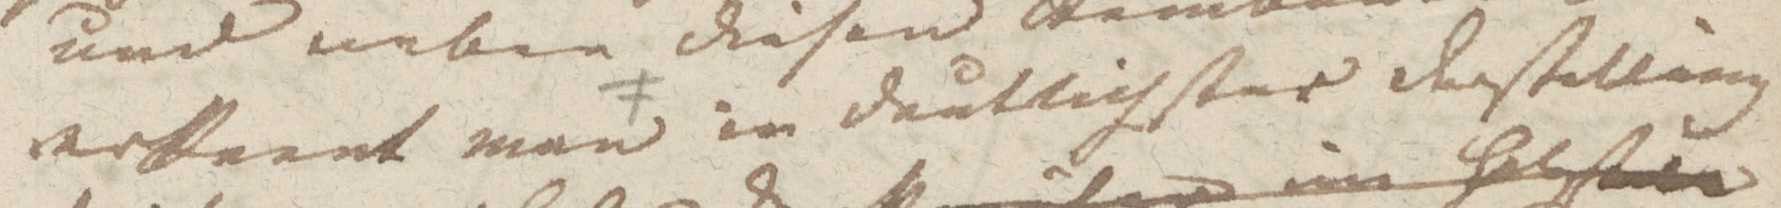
erkennt man %in deutlichster Darstellung
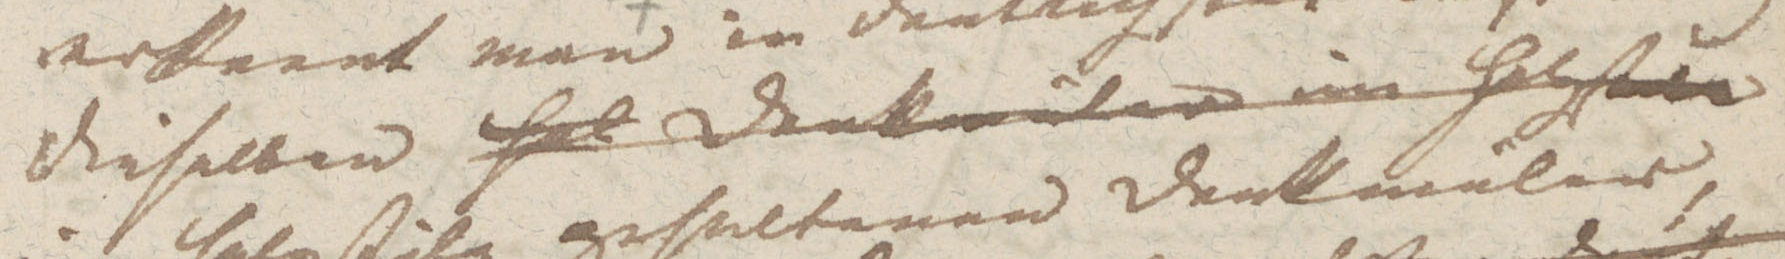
dieselben Hol Denkmäler im Holzstile
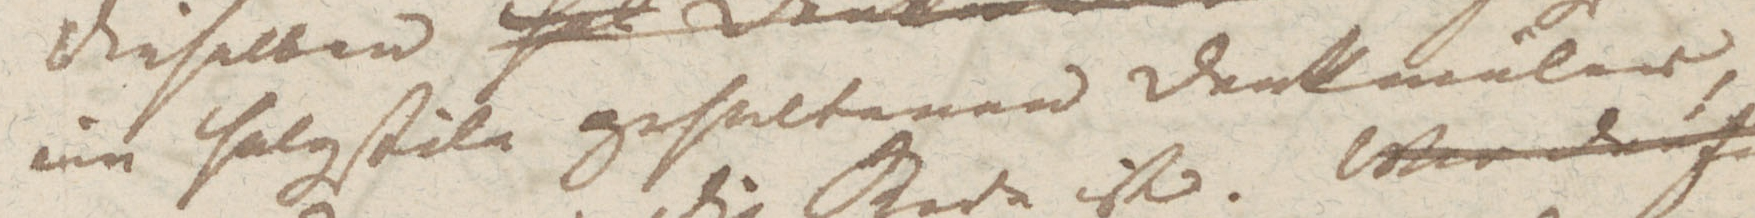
im Holzstile gehaltenen Denkmäler,
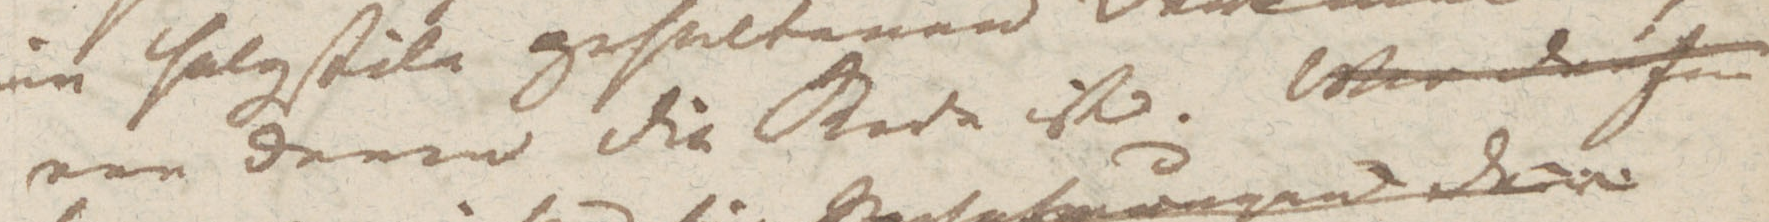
von denen die Rede ist. Wir dürfen
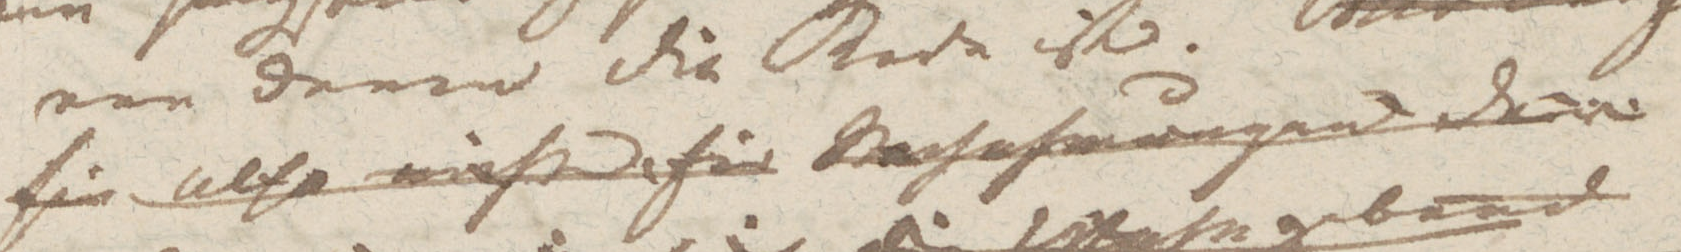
sie also nicht für Nachahmungen der
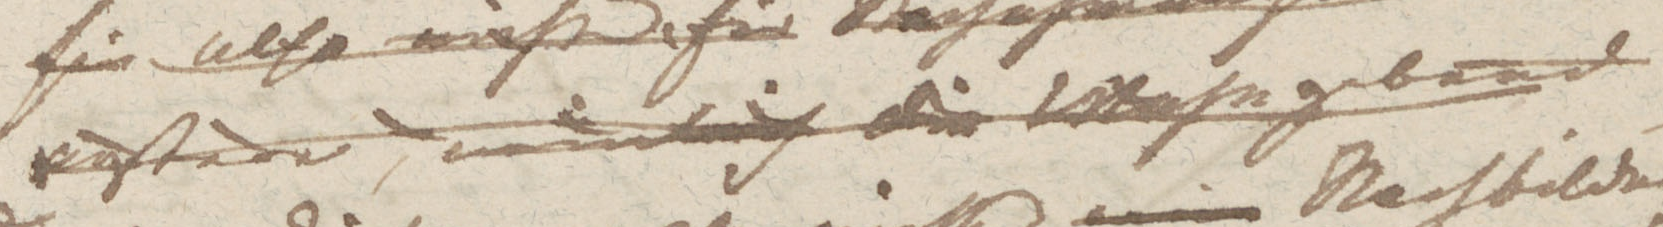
erstern, nämlich die Wohngebaud
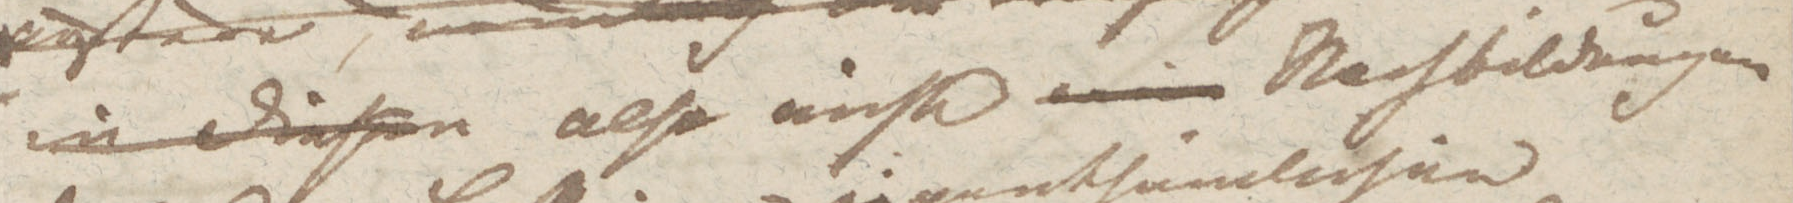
in diesen also nicht eine Nachbildungen
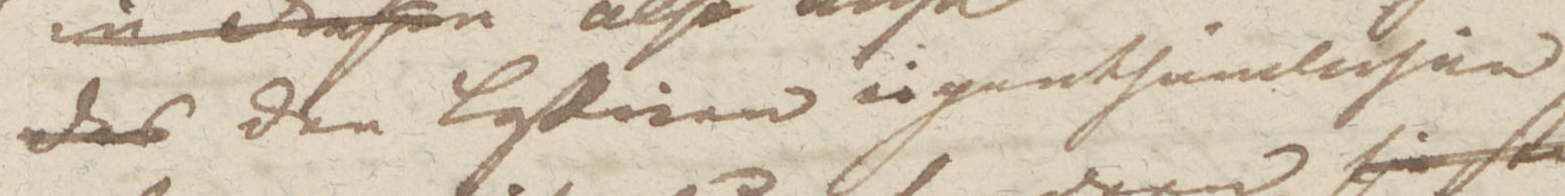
das den Lykiern eigenthümlichen
